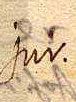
jur.
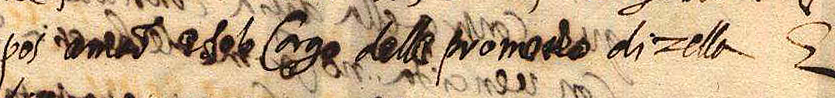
pos a maõ e sob Cago delle prometeo dizella E
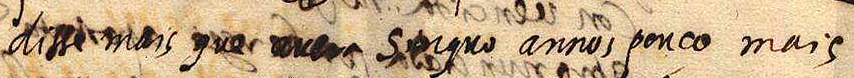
disse mais que auera sinquo annos pouco mais
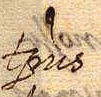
tpūs
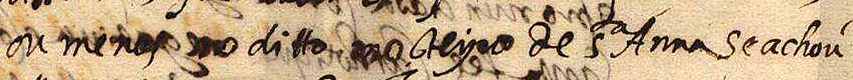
ou menos no ditto mosteyro de sta Anna se achou
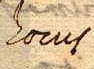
locus
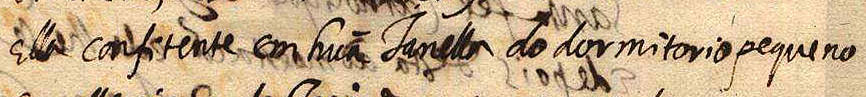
Ella confitente em huā Ianella do dormitorio pequeno
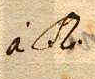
a R.
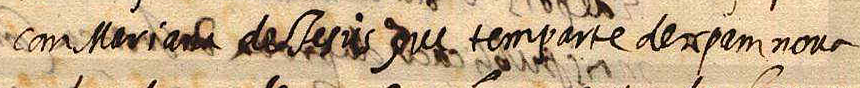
com Mariana de Iesus que tem parte de xpam noua
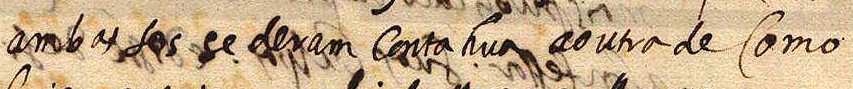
ambas sos se deram conta hua a outra de Como
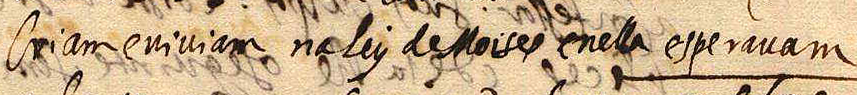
Criam e uiuiam na ley de Moises e nella esperauam
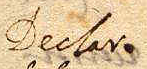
Declar.
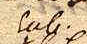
suli.
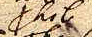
ꝓhib
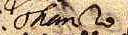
Than
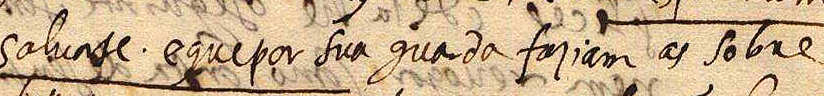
saluase. e que por sua guarda faziam as sobre
